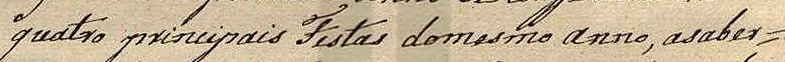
quatro principais Festas do mesmo anno, a saber
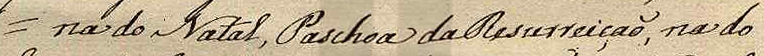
na do Natal, Paschoa da Resurreiçaõ, na do
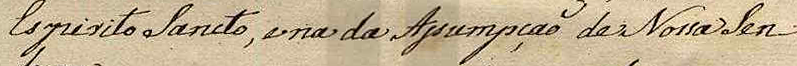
Espirito Sancto, e na da Assumpçaõ de Nossa Sen
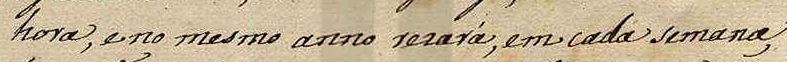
hora, e no mesmo anno rezará, em cada semana,
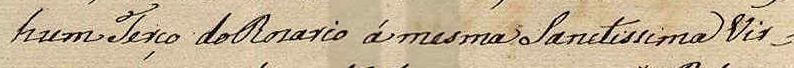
hum Terço do Rozario á mesma Sanctissima Vir
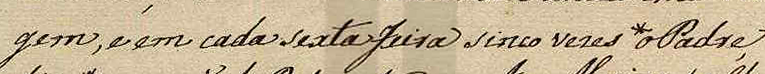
gem, e em cada sexta feira sinco vezes o Padre,
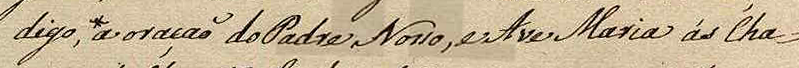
digo, a oraçaõ do Padre Nosso, e Ave Maria ás Cha
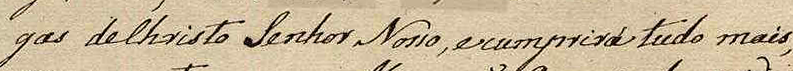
gas de Christo Senhor Nosso, e cumprirá tudo mais
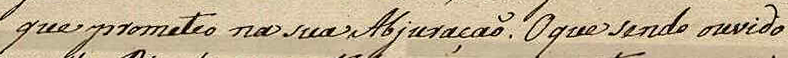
que prometeo na sua Abjuraçaõ. O que sendo ouvido
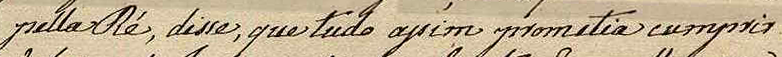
pella Ré, disse, que tudo assim prometia cumprir
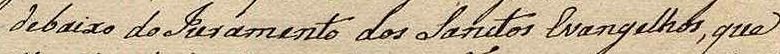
debaixo do Iuramento dos Sanctos Evangelhos, que
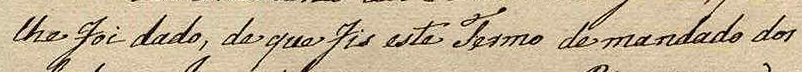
lhe foi dado, de que fis este Termo de mandado dos
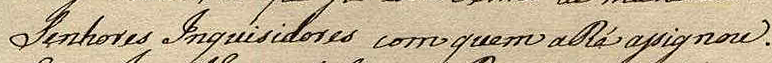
Senhores Inquisidores com quem a Ré assignou.
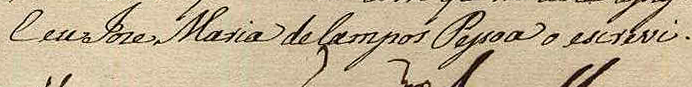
E eu Ioze Maria de Campos Pessoa o escrevi.
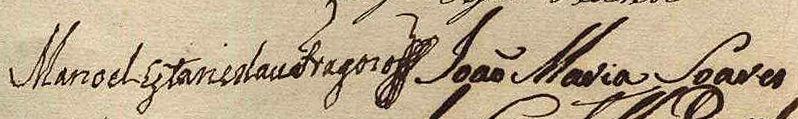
Manoel Estanislau Fragoso Ioaõ Maria Soares
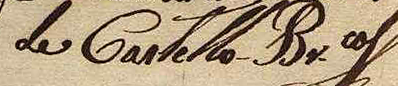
de Castello Br.co
